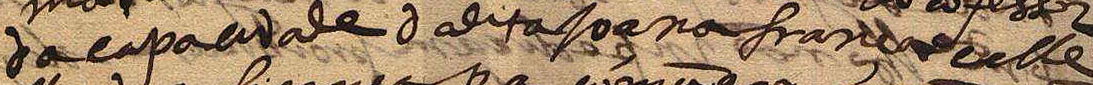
da capacidade da dita Joana franca e elle
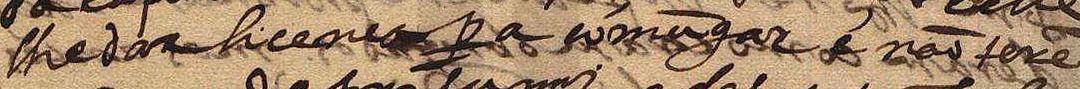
lhe dar licença ꝑa comūgar e não terē
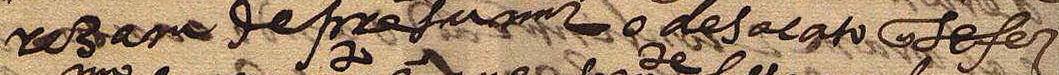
rezam de presumir o desacato q̄ se fez
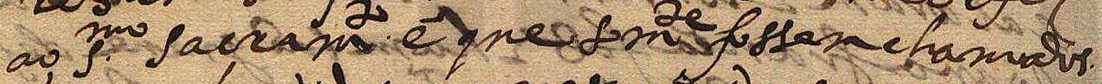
ao s.mo sacramto. e que somte fossem chamados
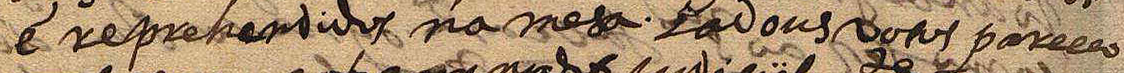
e reprehendidos na mesa. E a dous votos pareceo
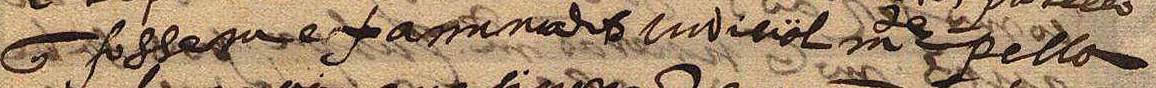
q̄ fossem examinados judicialmte pella
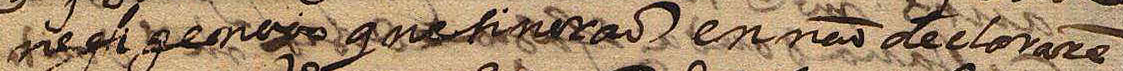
negligencia que tiueraõ en não declararē
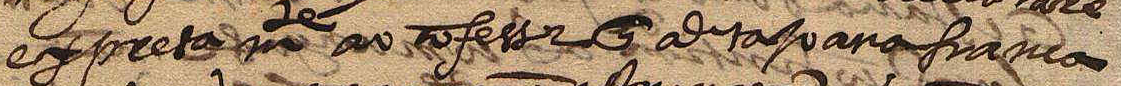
expresamte ao c̄ofessor q̄ a dita Joana franca
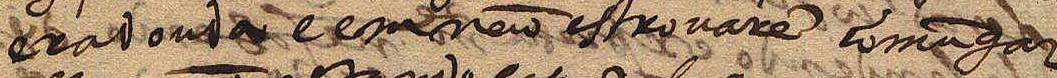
era douda e em não estrouarē cōmūgar
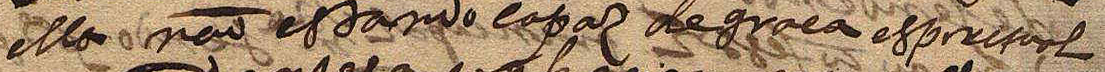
ella não estando capaz de graça espiritual
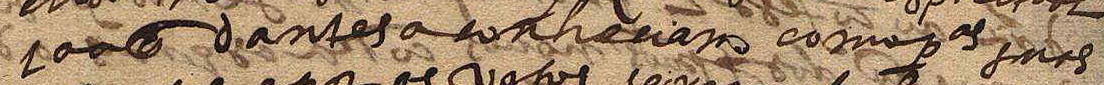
jaa q̄ dantes a conheciam como pas suas
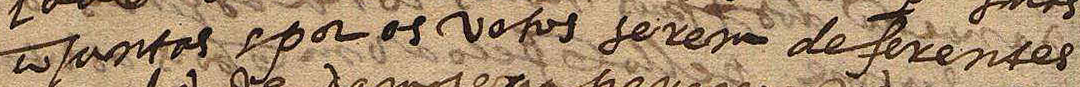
c̄oJuntas E por os votos serem deferentes
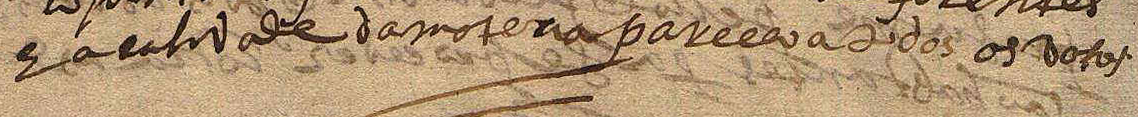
E a calidade da materia pareceo a todos os votos
